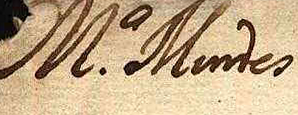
M.a Mendes
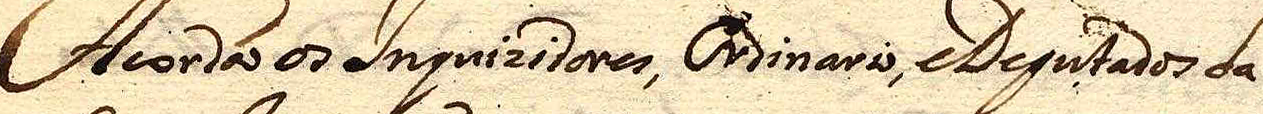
Acordão os Inquizidores, Ordinario, e Deputados da
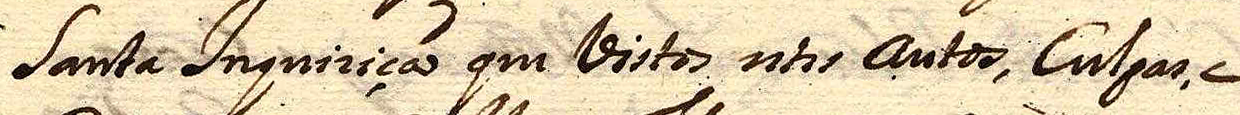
Santa Inquizição que Vistos estes Autos, Culpas, e
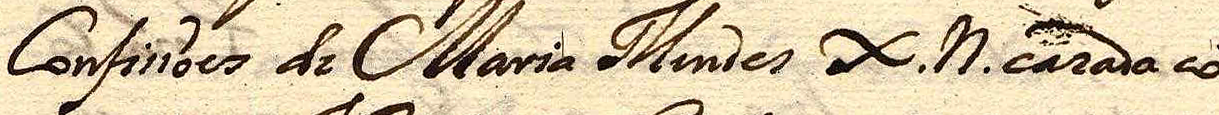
Confissões de Maria Mendes X. N. cazada cō
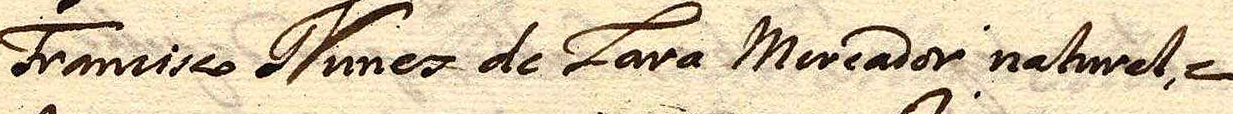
Francisco Nunes de Lara Mercador natural, e
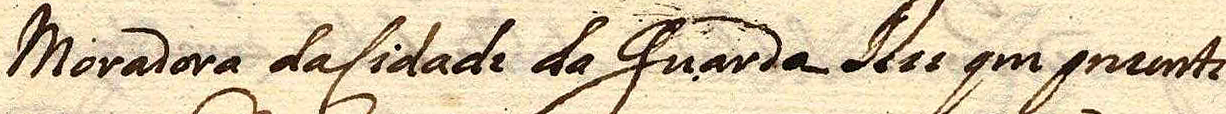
Moradora da Cidade da Guarda Ree que prezente
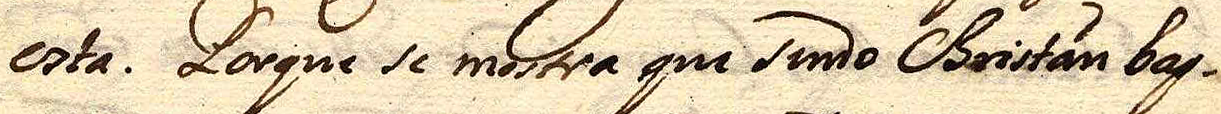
esta. Porque se mostra que sendo Christān bap
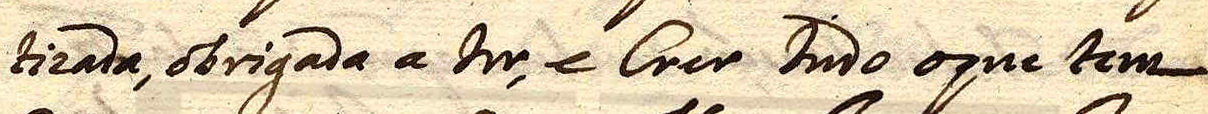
tizada, obrigada a ter, e Crer tudo o que tem
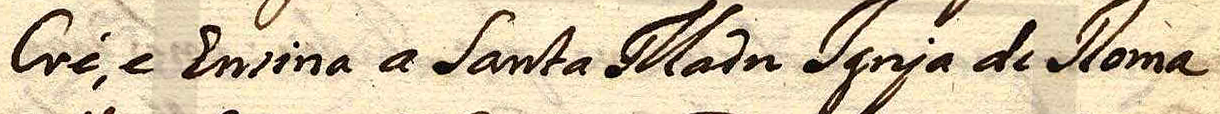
Cré, e Ensina a Santa Madre Igreja de Roma
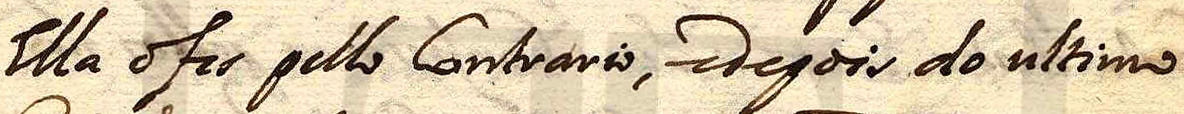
Ella o fes pello Contrario, e depois do ultimo
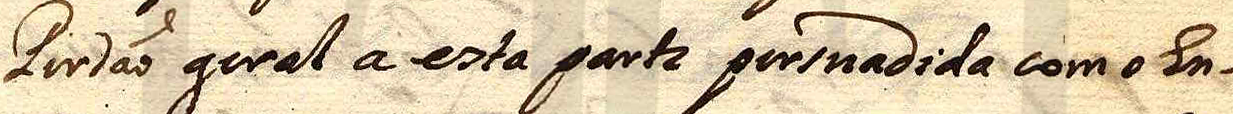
Perdaõ geral a esta parte persuadida com o En
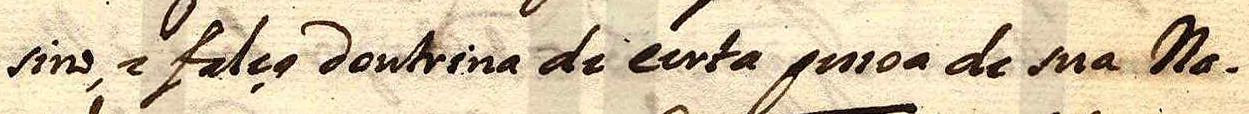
sino, a falça doutrina de certa pessoa de sua Na
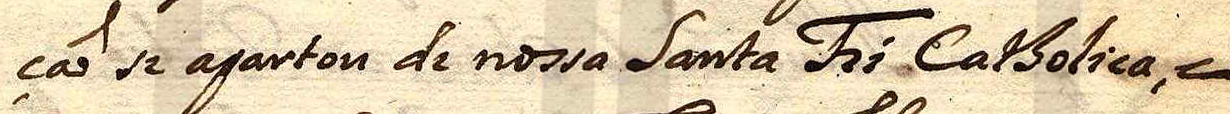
çaõ se apartou de nossa Santa Feé Catholica,
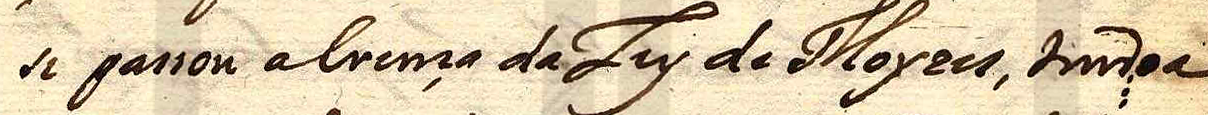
se passou a Crença da Ley de Moyzes, tendoa
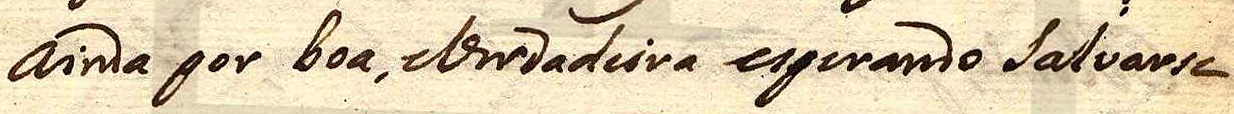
ainda por boa, e verdadeira esperando salvarse
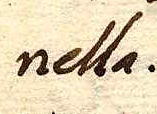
nella.
